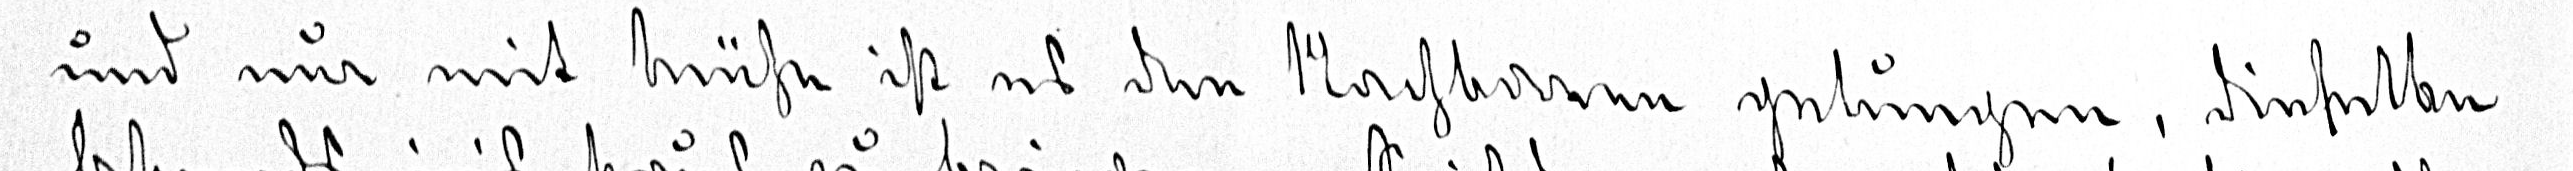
und nur mit Mühe ist es den Nachbaren gelungen, dieselbe
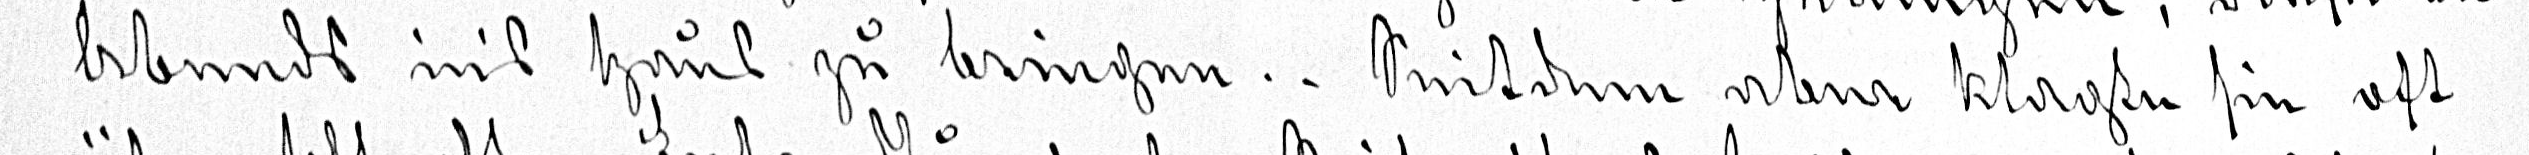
Abends in's Haus zu bringen.- Seitdem aber klagte sie oft
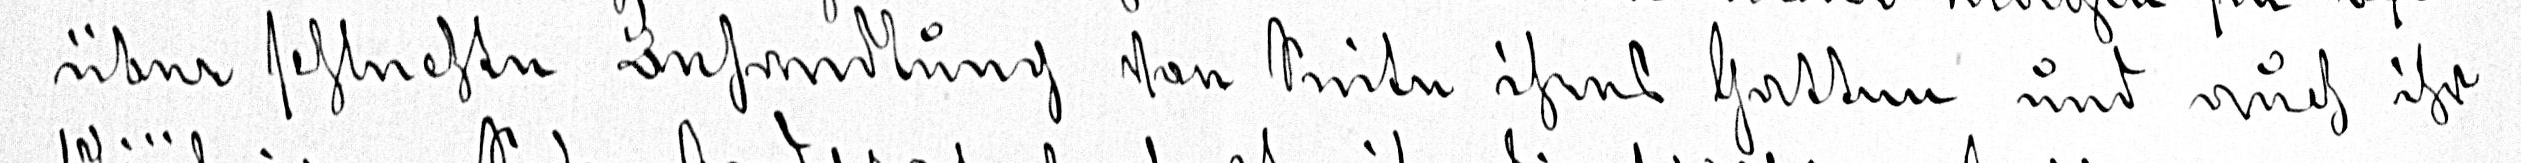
über schlechte Behandlung von Seite ihres Gatten und auch ihr
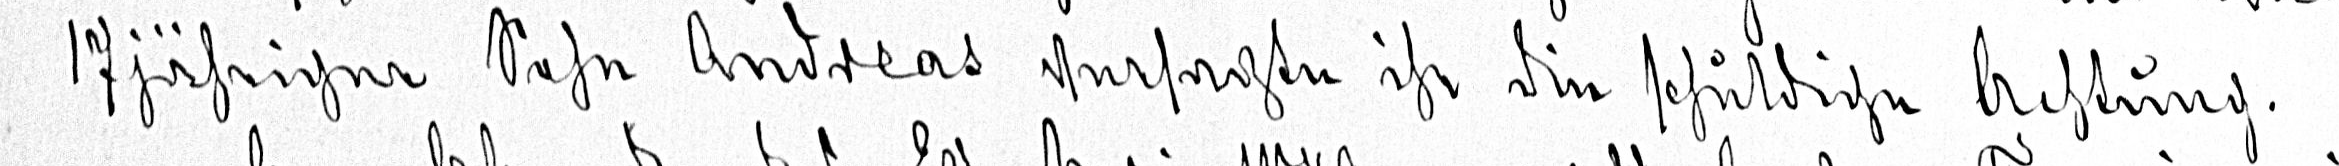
17jähriger Sohn Andreas versagte ihr die die schuldige Achtung.
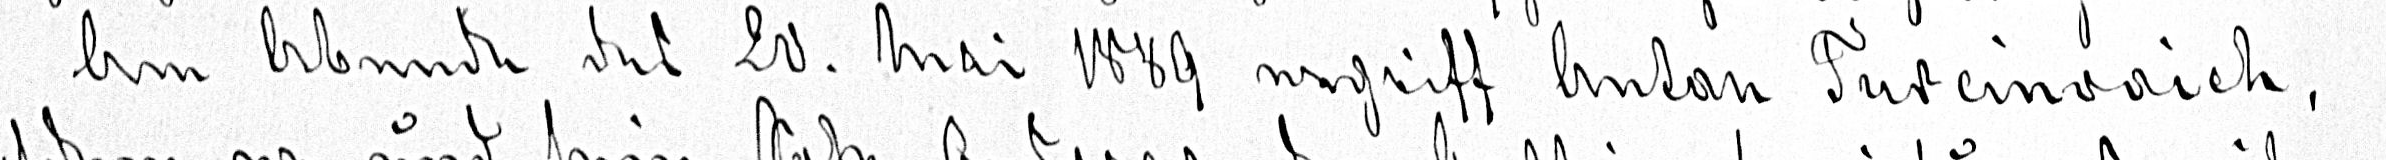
Am Abende des 20. Mai 1889 ergriff Anton Turcinovich,
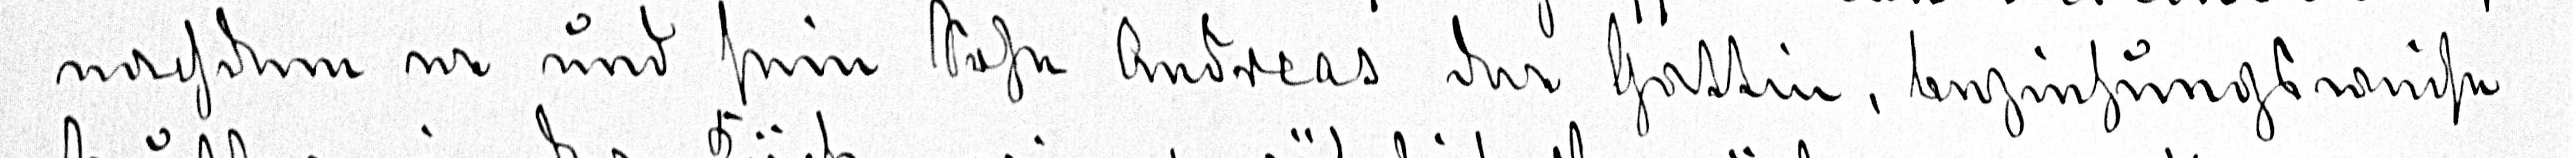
nachdem er und sein Sohn Andreas der Gattin, beziehungsweise
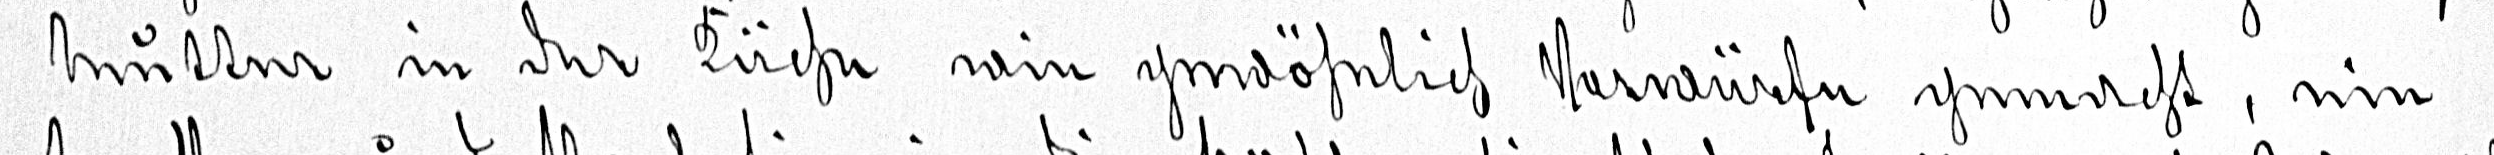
Mutter in der Küche wie gewöhnlich Vorwürfe gemacht, ein
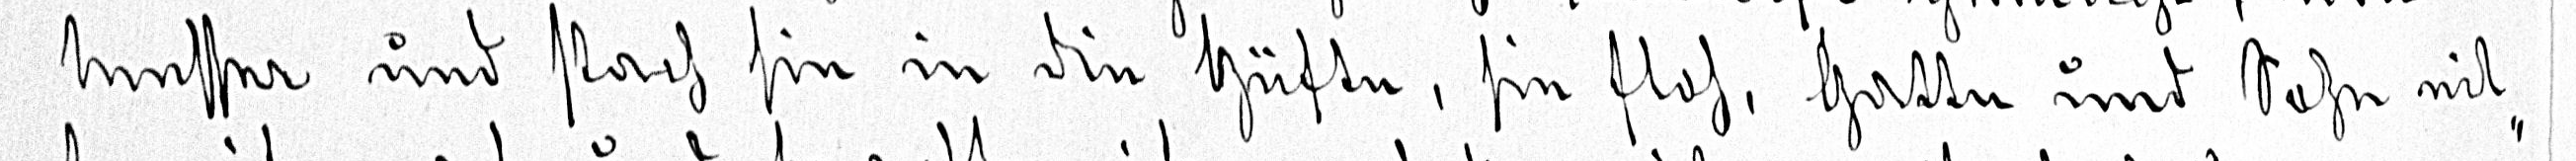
Messer und stach sie in die Hüfte, sie floh, Gatte und Sohn eil¬
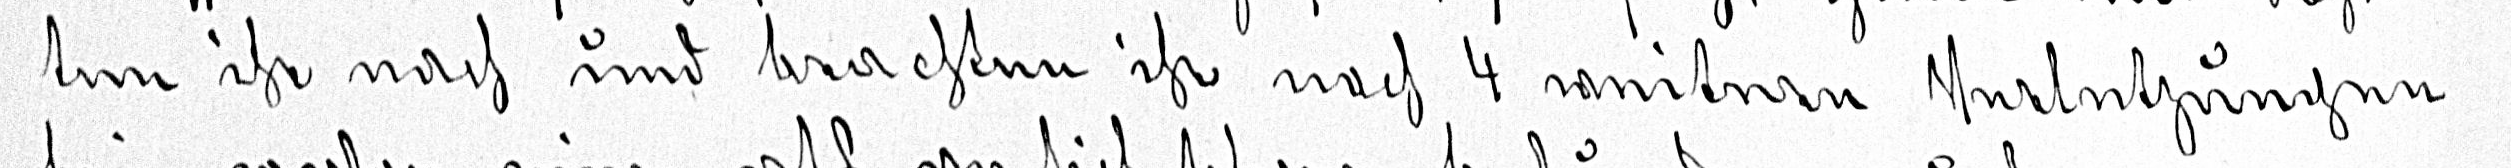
ten ihr nach und brachten ihr noch 4 weitern Verletzungen
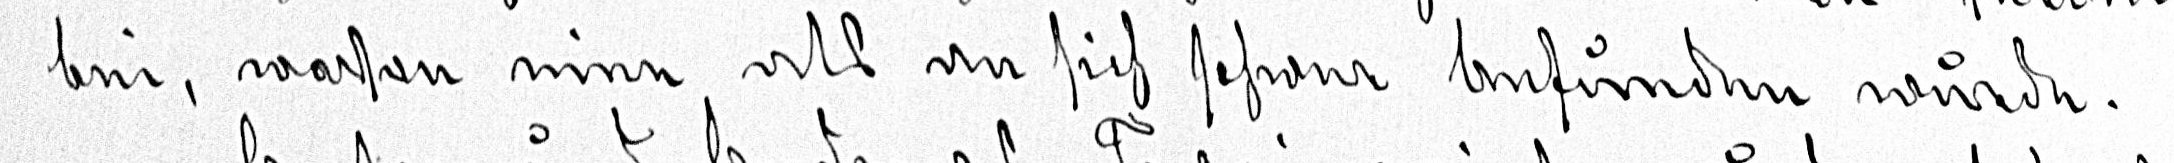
bei, wovon eine als an sich schwer befunden wurde.
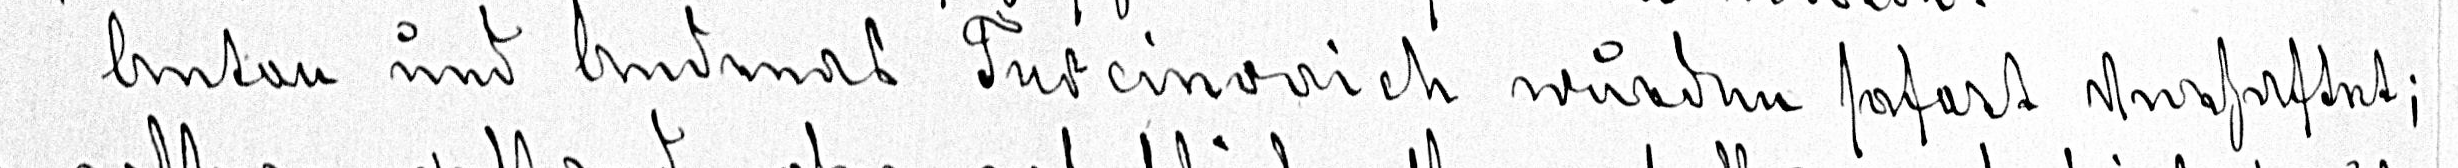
Anton und Andreas Turcinovich wurden sofort verhaftet;
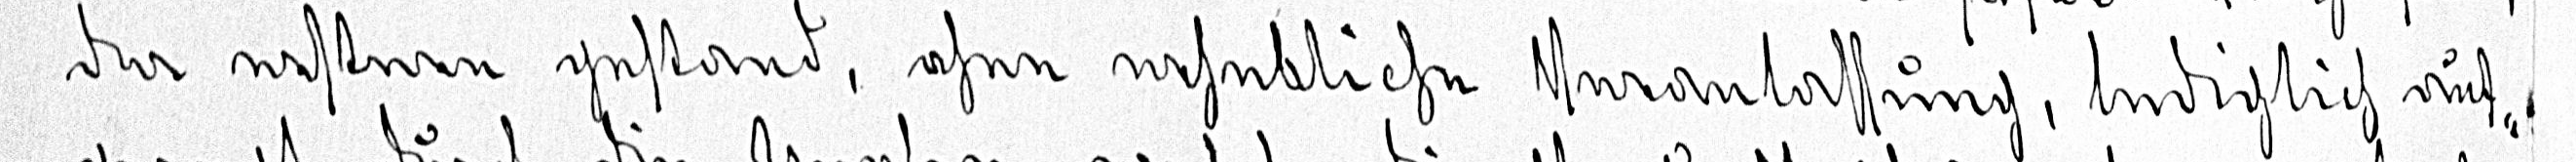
der erstere gestand, ohne erhebliche Veranlassung, lediglich auf¬
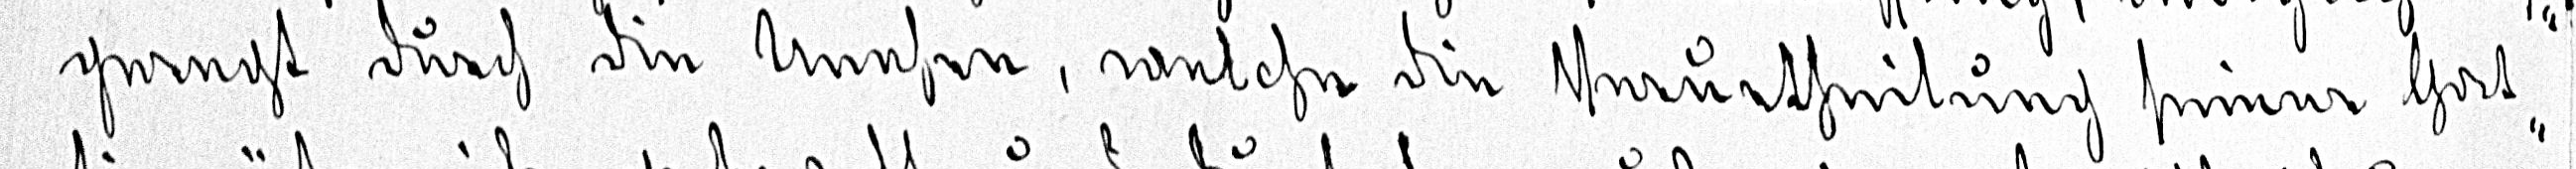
geregt durch die Unehre, welche die Verurtheilung seiner Gat¬
